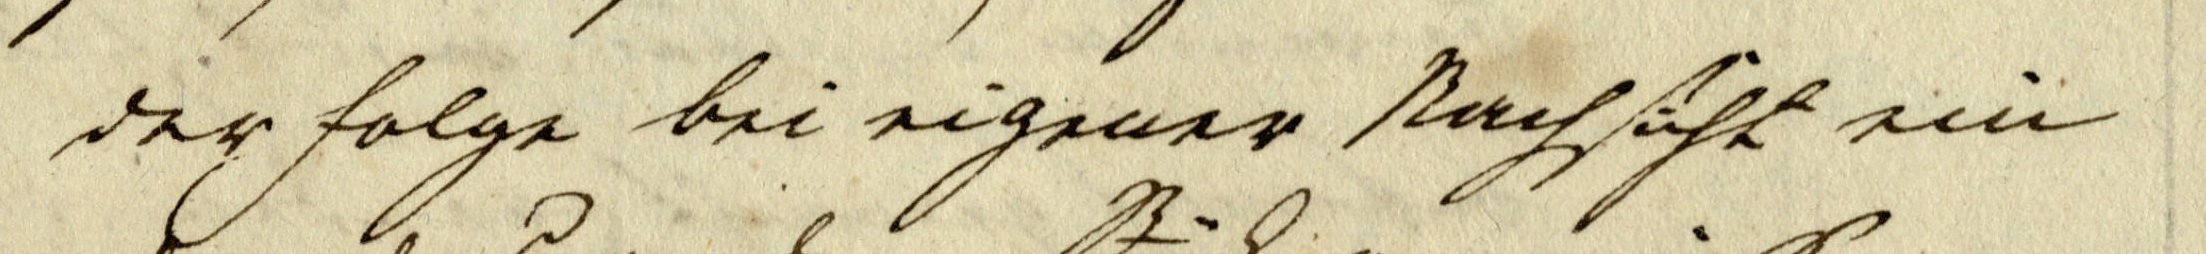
der Folge bei eigener Nachsicht ein
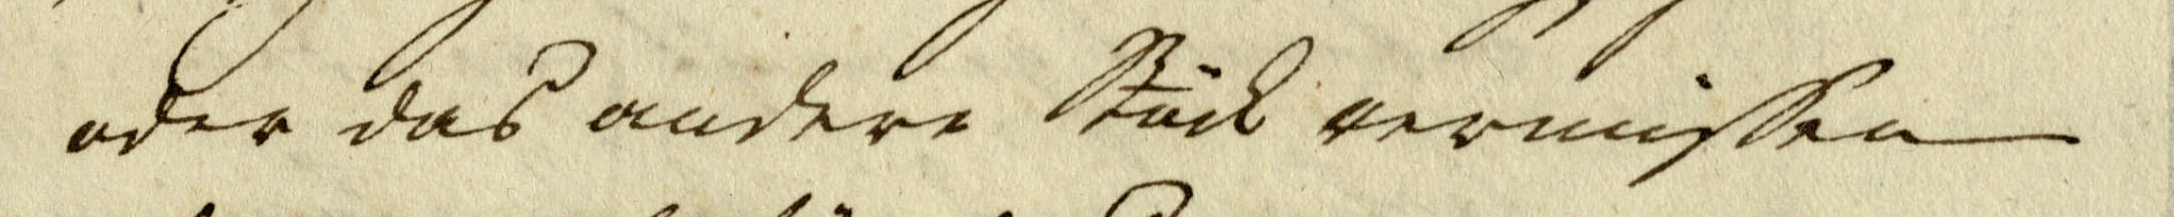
oder das andere Stück vermissen
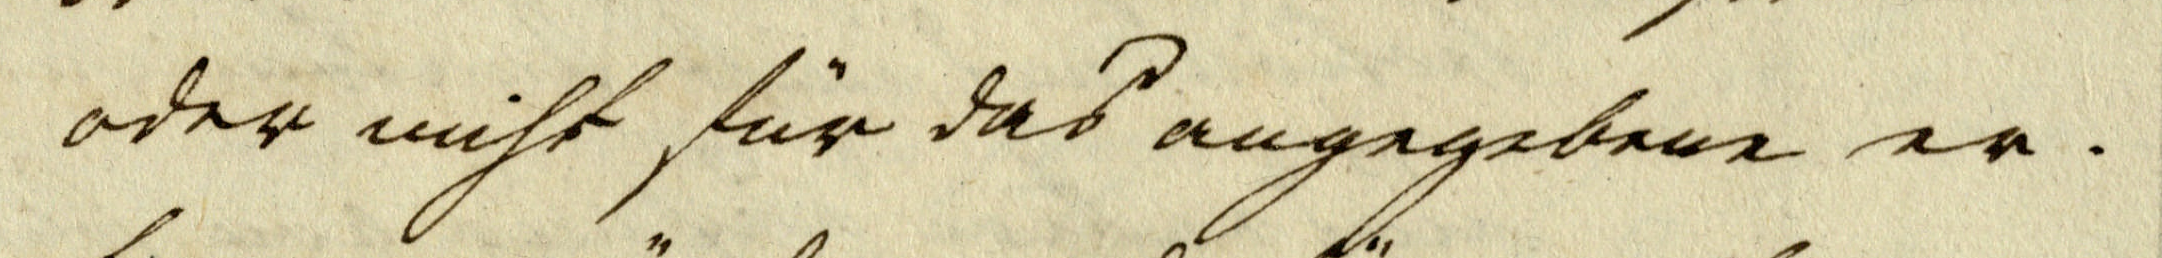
oder nicht für das angegebene er¬
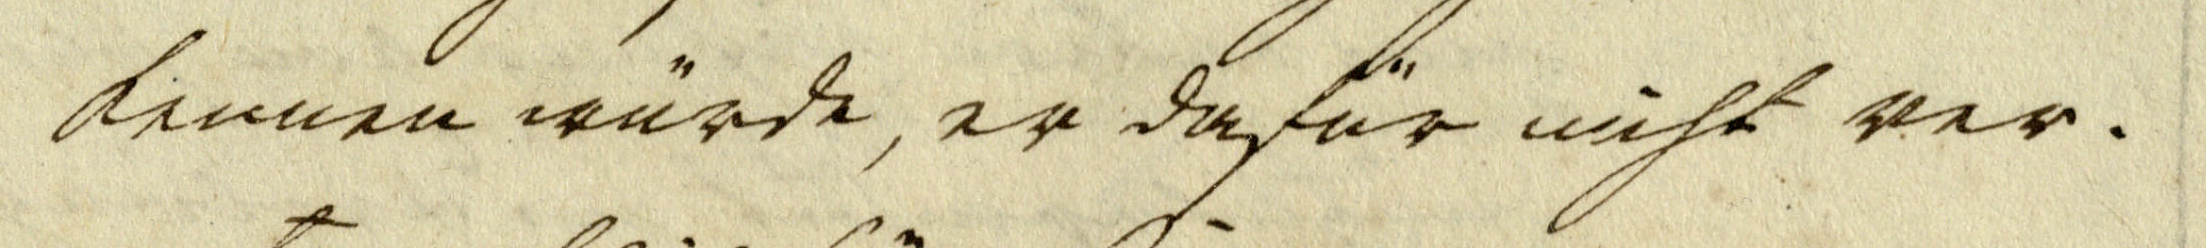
kennen würde, er dafür nicht ver¬
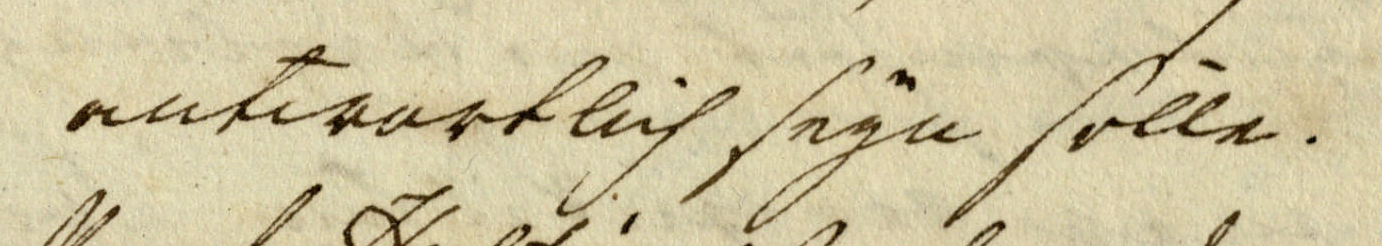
antwortlich seÿn solle.
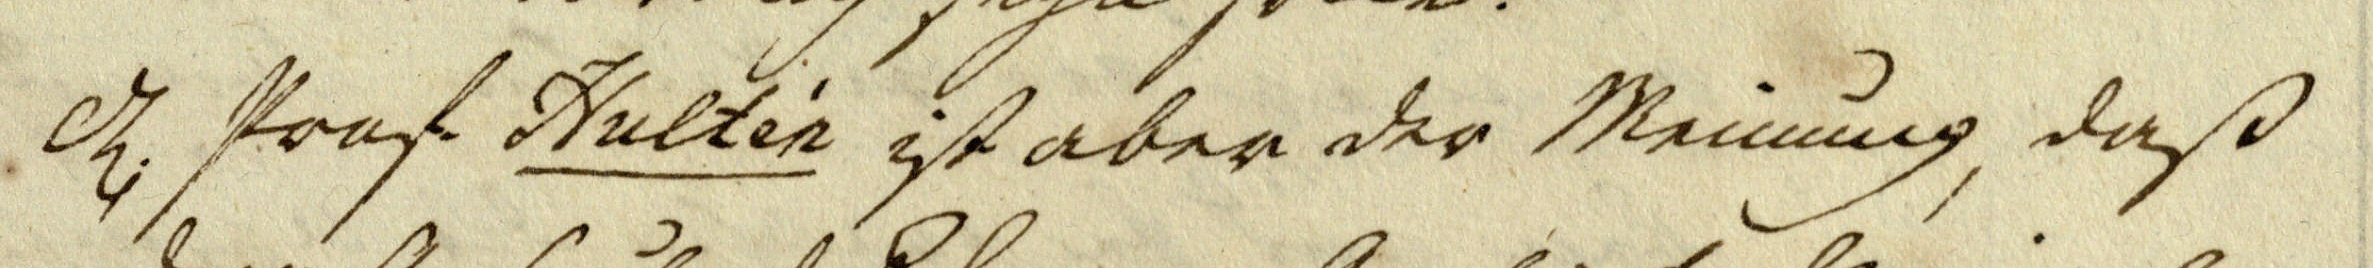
dh. Prof. Hultén ist aber der Meinung, daß
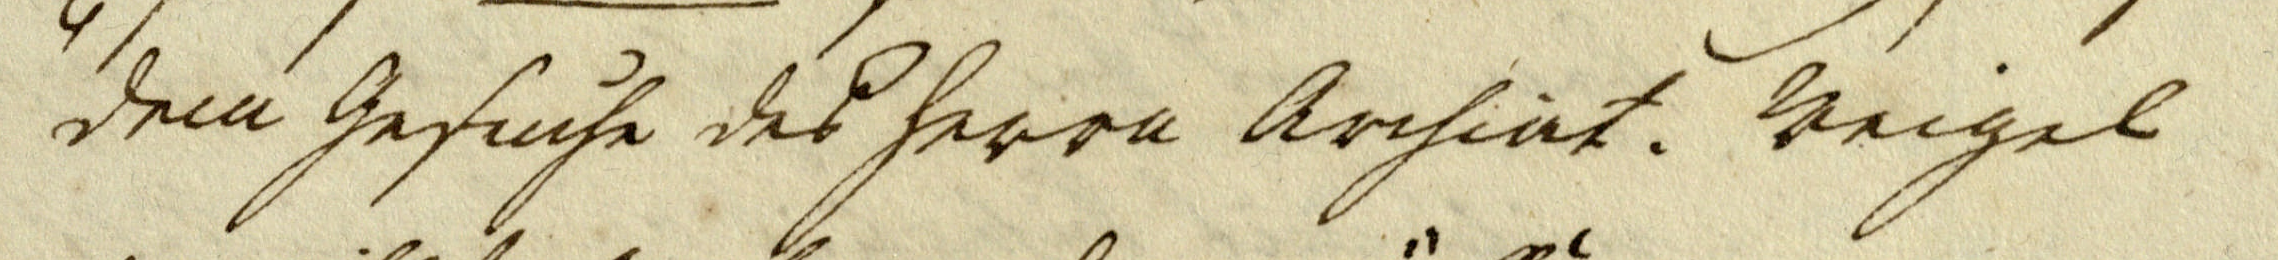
dem Gesuche des Herrn Archiat. Weigel
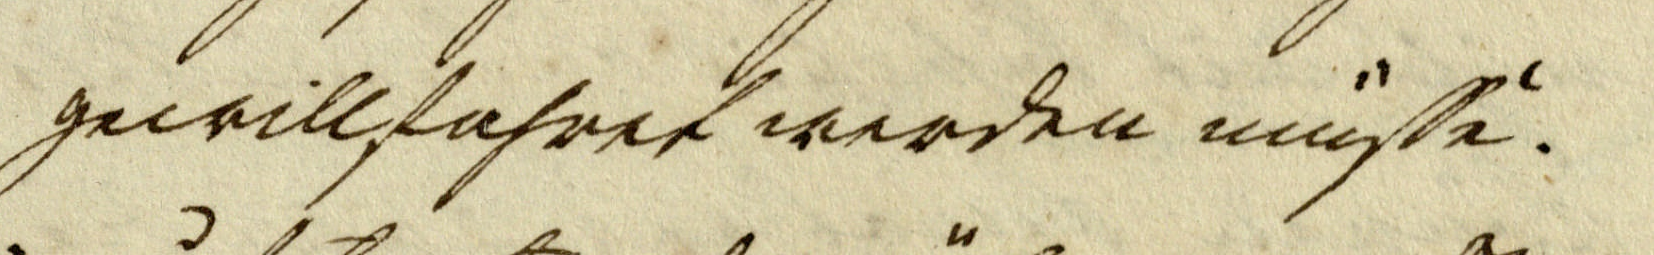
gewillfahret werden müsse.
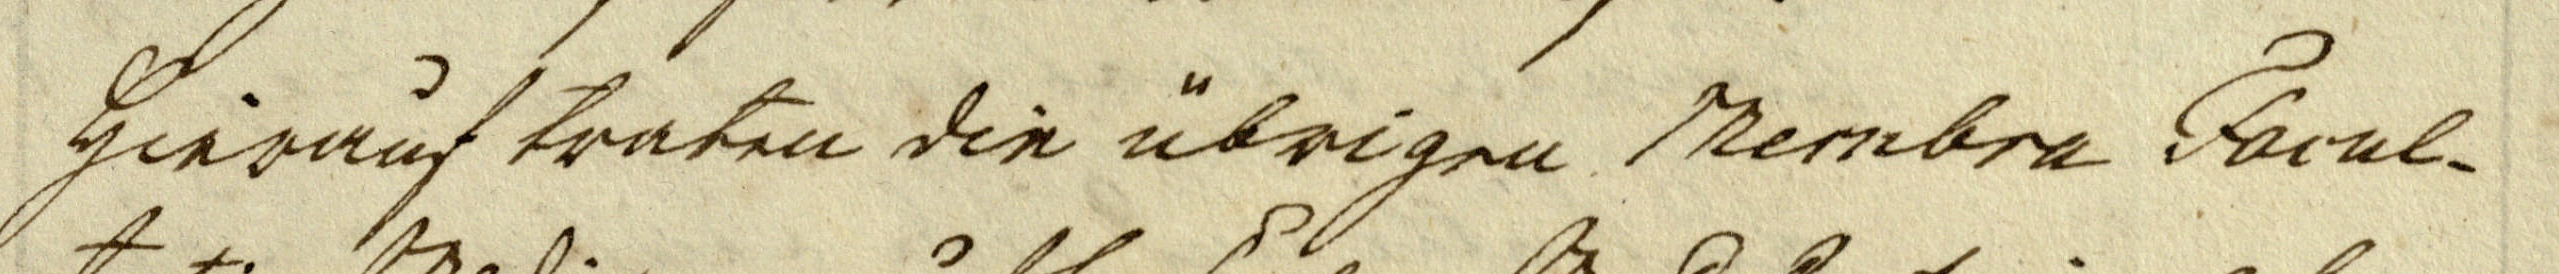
Hierauf traten die übrigen Membra Facul¬
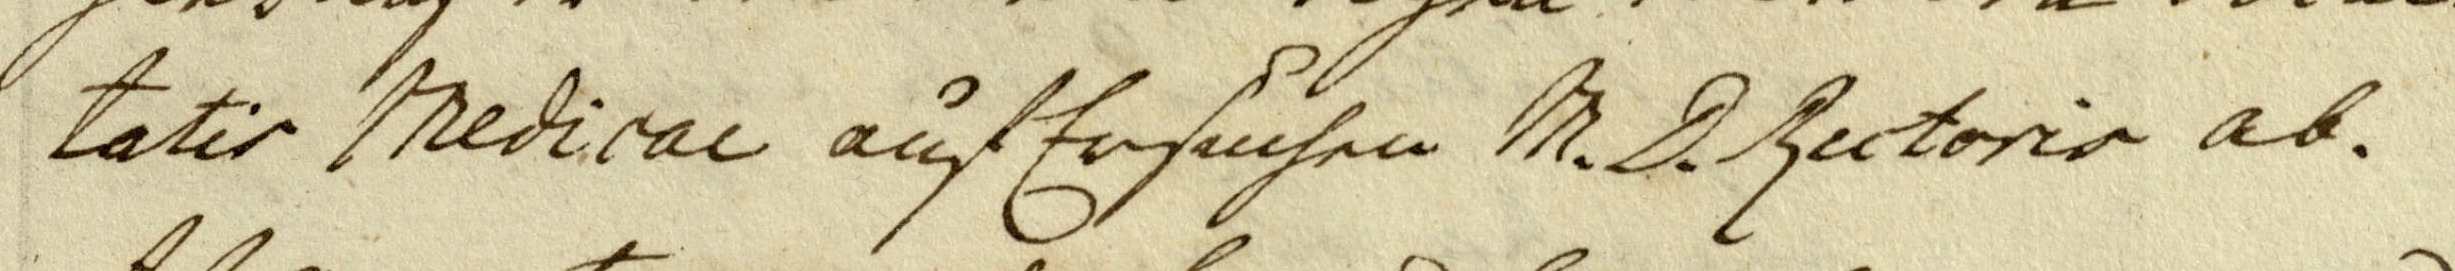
tatis Medicae auf Ersuchen M. D. Rectoris ab.
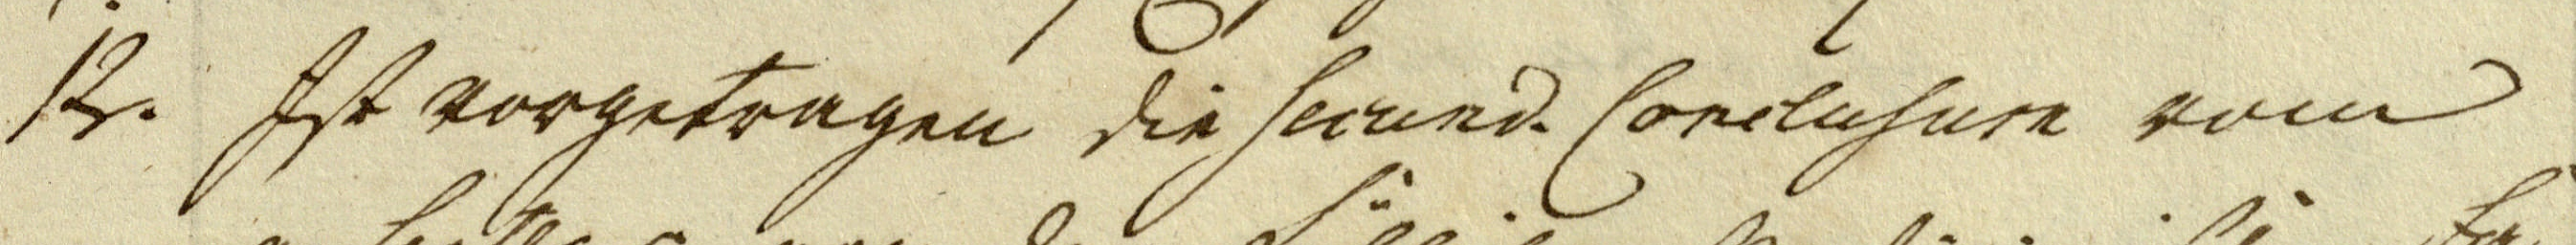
12. Ist vorgetragen die secund. Conclusum vom
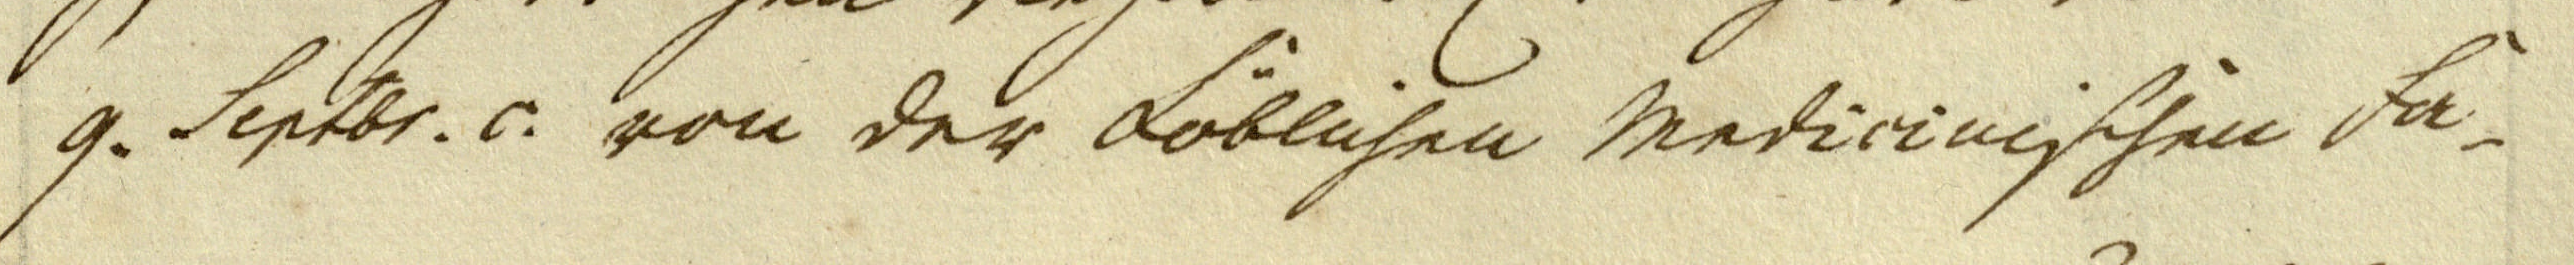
9. Septbr. c. von der Löblichen Medicinischen Fa¬
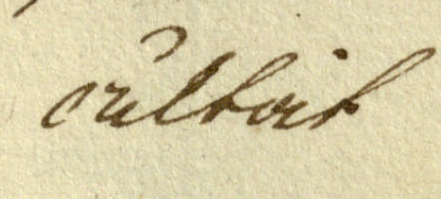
cultät
